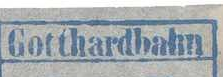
Hochgeachteter
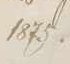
Herr
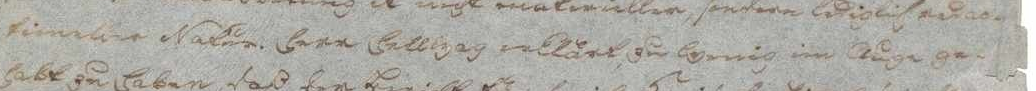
tioneller Natur. Herr Hellwag erklärt, zu wenig im Auge ge-
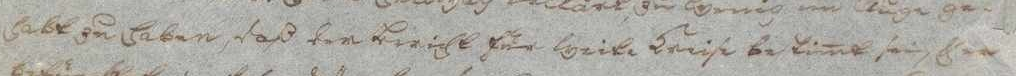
habt zu haben, daß der Bericht für weite Kreise bestimmt sei, & er
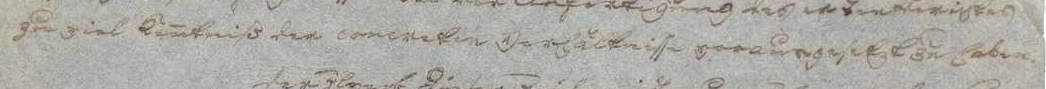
zu viel Kenntniß der concreten Verhältnisse vorausgesetzt zu haben.
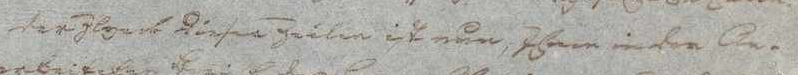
Der Zweck dieser Zeilen ist nun, Ihnen in der An-
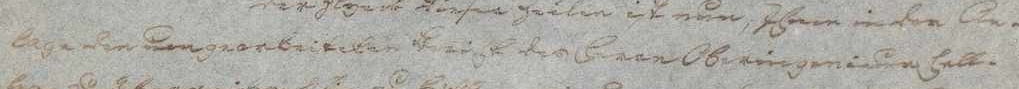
lage den umgearbeiteten Bericht des Herrn Oberingenieur Hell-
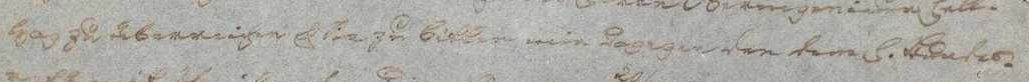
wag zu überreichen & Sie zu bitten, mir dagegen den dem H. Bundes-
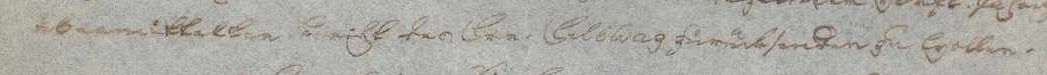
übermittelten Bericht des Hrn. Hellwag zurücksenden zu wollen.
